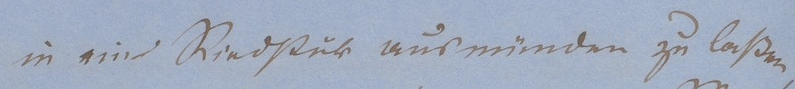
in ein Riedstük ausmünden zu laßen,
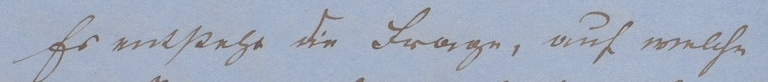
Es entsteht die Frage, auf welche
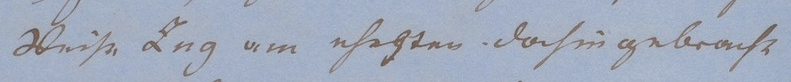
Weise Zug am ehesten dahin gebracht
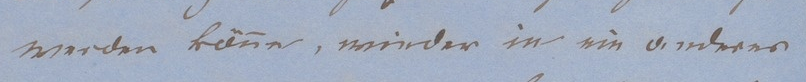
werden könne, wieder in ein anderes
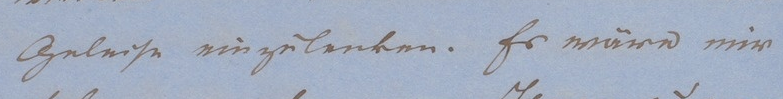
Geleise einzulenken. Es wäre mir
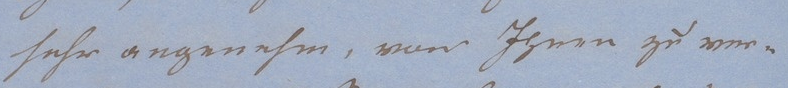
sehr angenehm, von Ihnen zu ver-
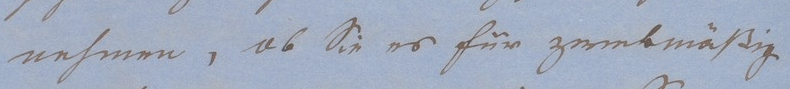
nehmen, ob Sie es für zwekmäßig
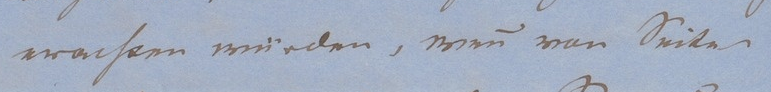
erachten würden, wenn von Seite
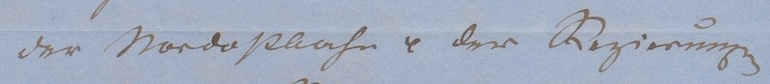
der Nordostbahn & der Regierung
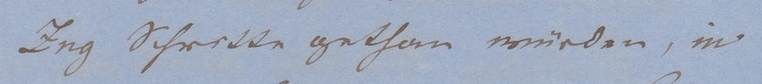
Zug Schritte gethan würden, in
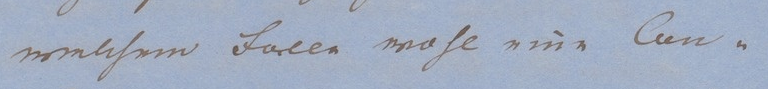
welchem Falle wohl eine Con-
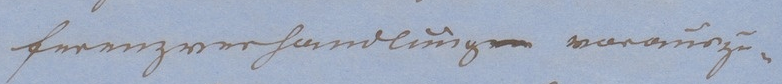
ferenzverhandlungen vorauszu-
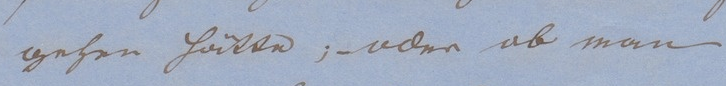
gehen hätte; – oder ob man
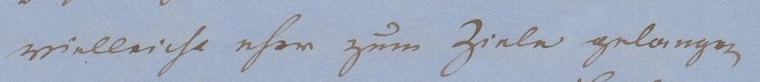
vielleicht eher zum Ziele gelangen
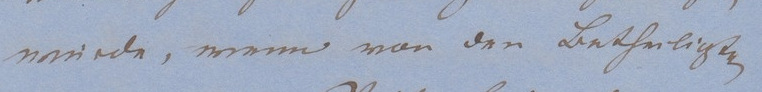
würde, wenn von den Betheiligten
